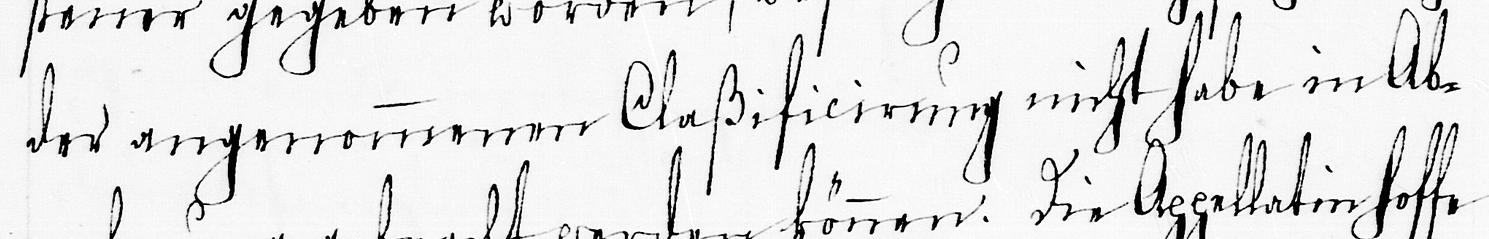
der angenommenen Claßificirung nicht habe in Ab¬
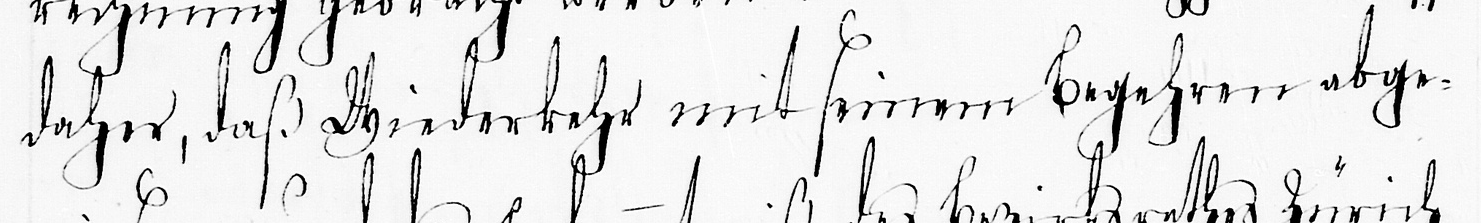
daher, daß Wiederkehr mit seinem Begehren abge¬
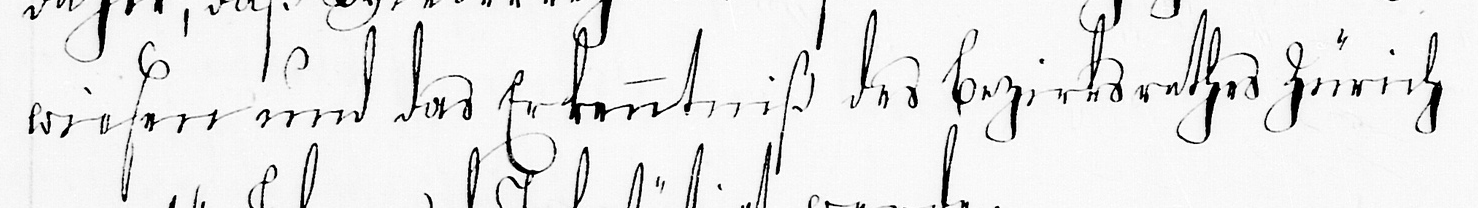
wiesen und das Erkenntniß des Bezirksrathes Zürich
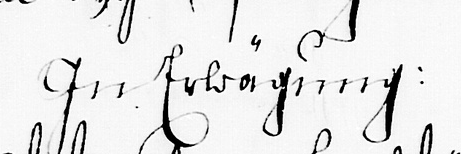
In Erwägung:
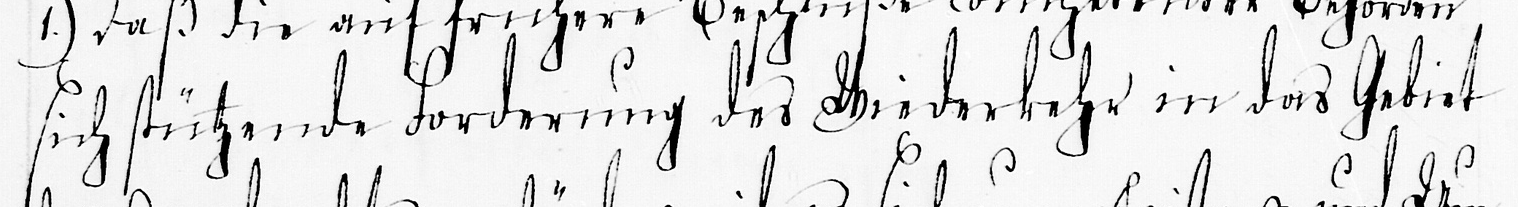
sich stützende Forderung des Wiederkehr in das Gebiet
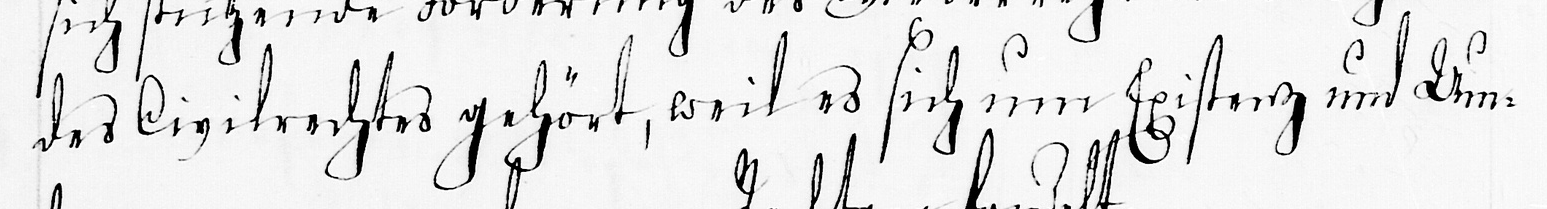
des Civilrechtes gehört, weil es sich um Existenz und Um¬
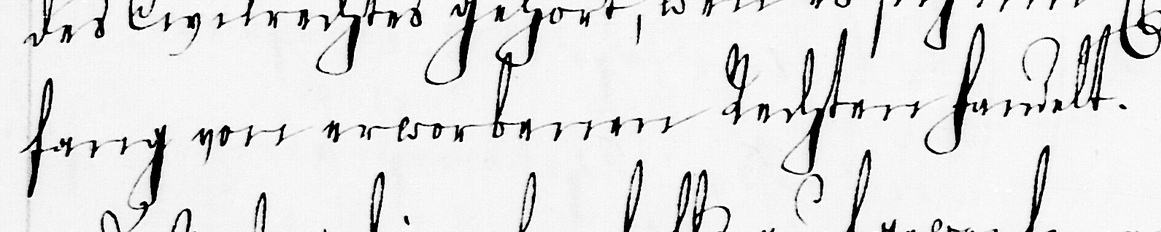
fang von erworbenen Rechten handelt.
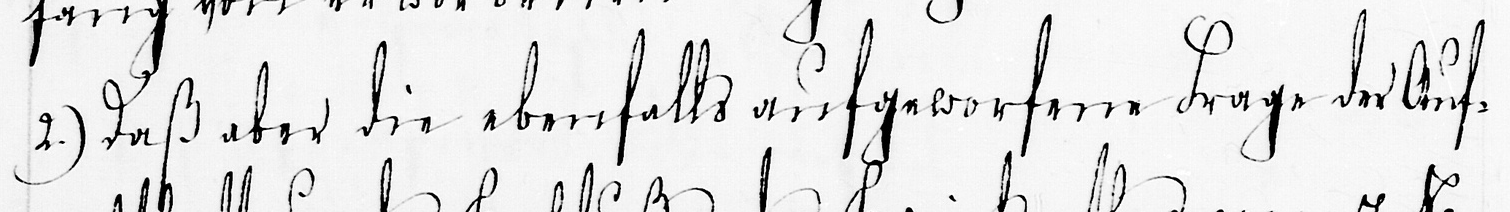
2.) Daß aber die ebenfalls aufgeworfene Frage der Auf¬
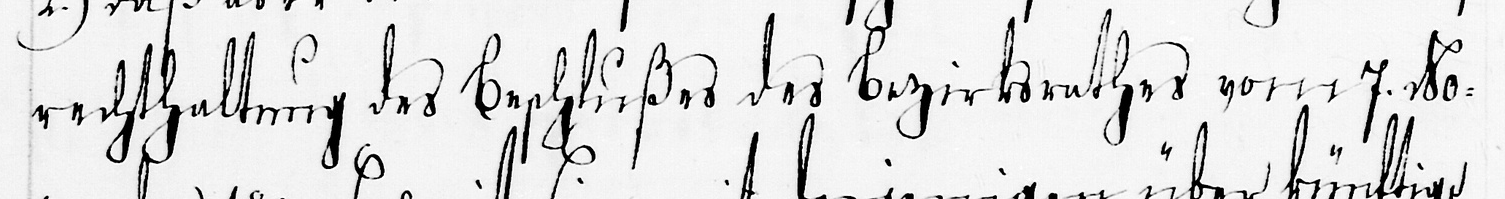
rechterhaltung des Beschlußes des Bezirksrathes vom 7. No¬
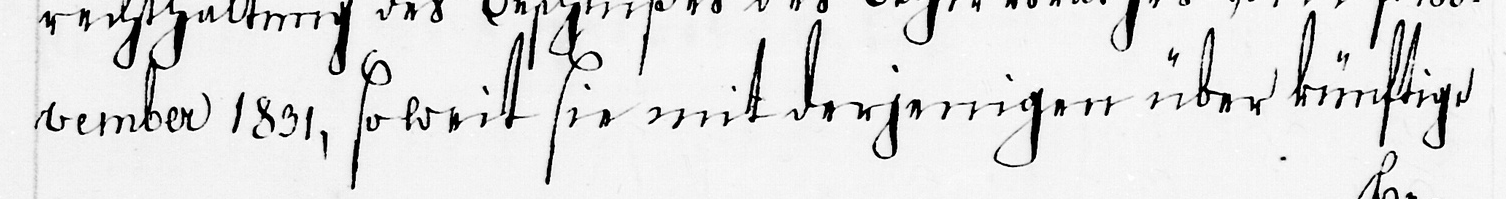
vember 1831, so weit sie mit derjenigen über künftige
